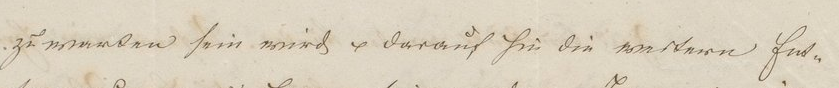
zuwarten sein wird & darauf hin die weitern Ent-
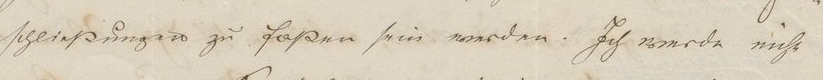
schließungen zu faßen sein werden. Ich werde nicht
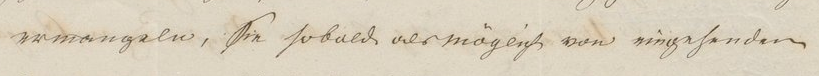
ermangeln, Sie sobald als möglich von eingehenden
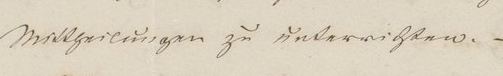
Mittheilungen zu unterrichten. –
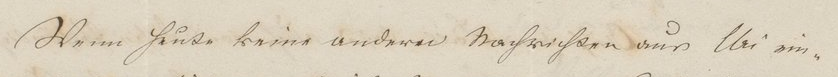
Wenn heute keine anderen Nachrichten aus Uri ein-
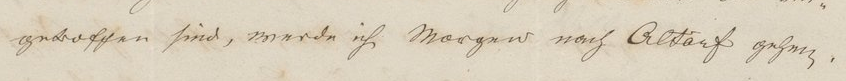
getroffen sind, werde ich Morgen nach Altorf gehen.
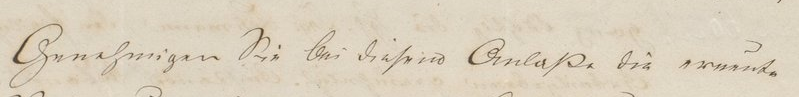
Genehmigen Sie bei diesem Anlaße die erneute
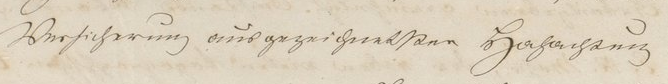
Versicherung ausgezeichnetster Hochachtung
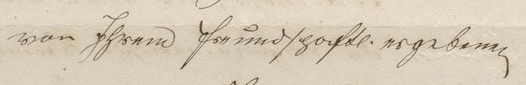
von Ihrem freundschaftl. ergebenen
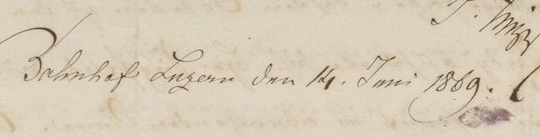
Bahnhof Luzern den 14. Juni 1869.
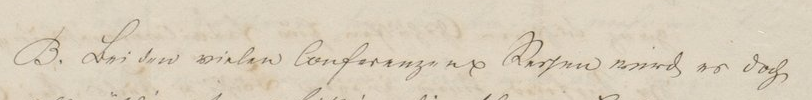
B. Bei den vielen Conferenzen & Reisen wird es doch
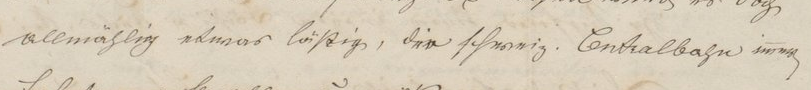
allmählig etwas lästig, der schweiz. Centralbahn immer
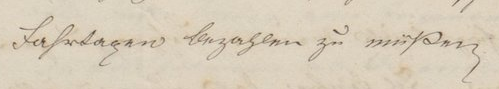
Fahrtaxen bezahlen zu müßen.
